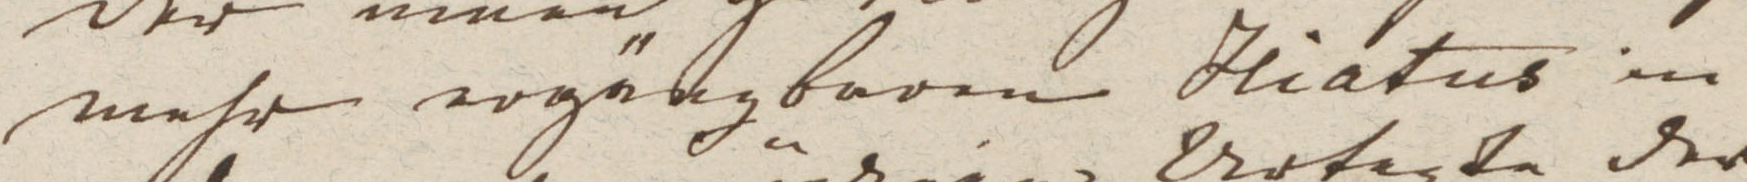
mehr ergänzbaren Hiatus in
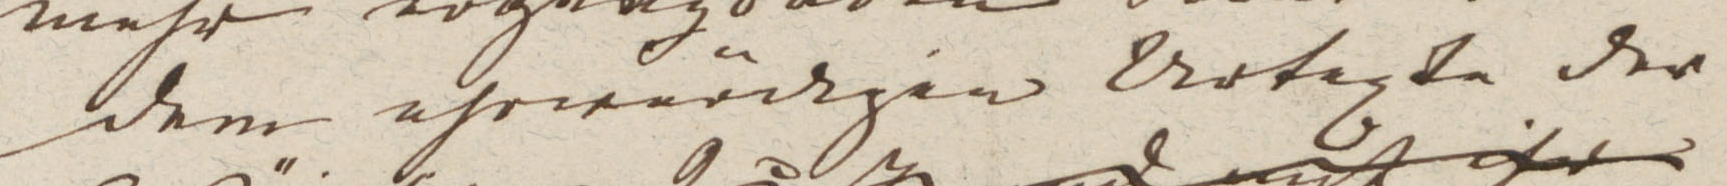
dem ehrwürdigen Urtexte der
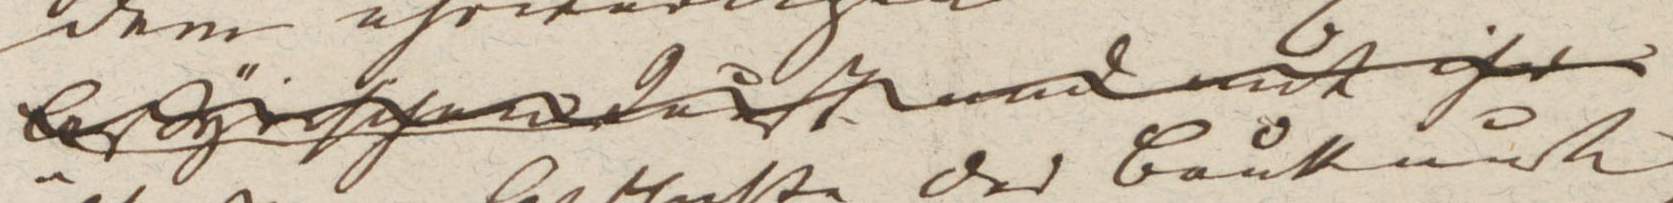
Assyrischen Kunst und mit ihr
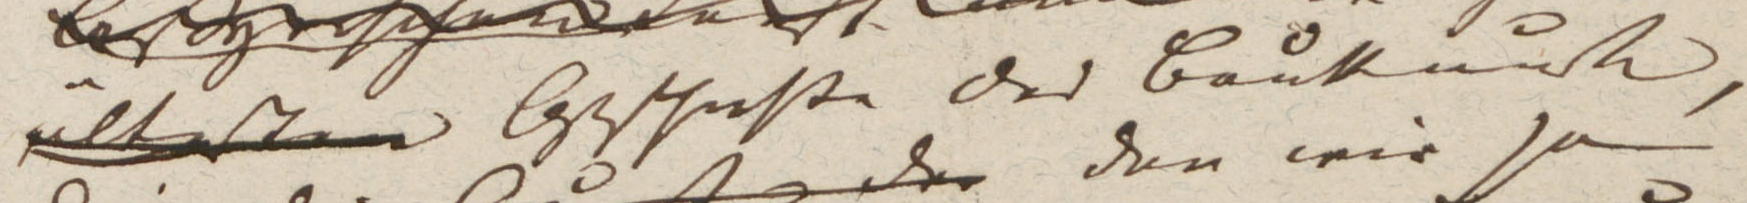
ältesten Geschichte der Baukunst,
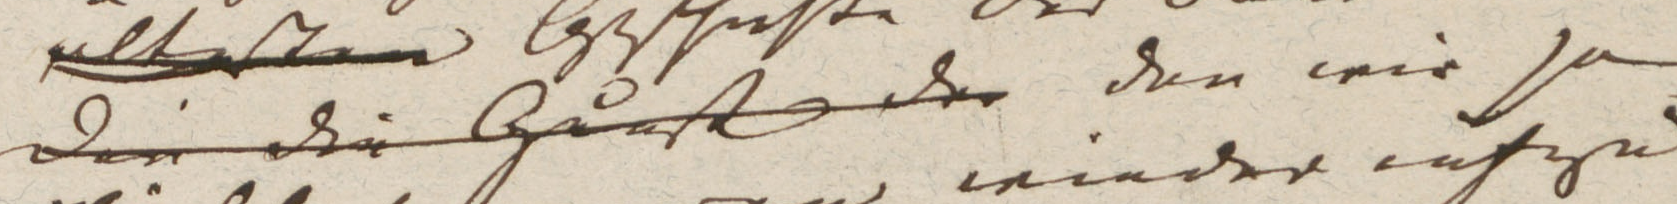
die die Gunst de den wir so
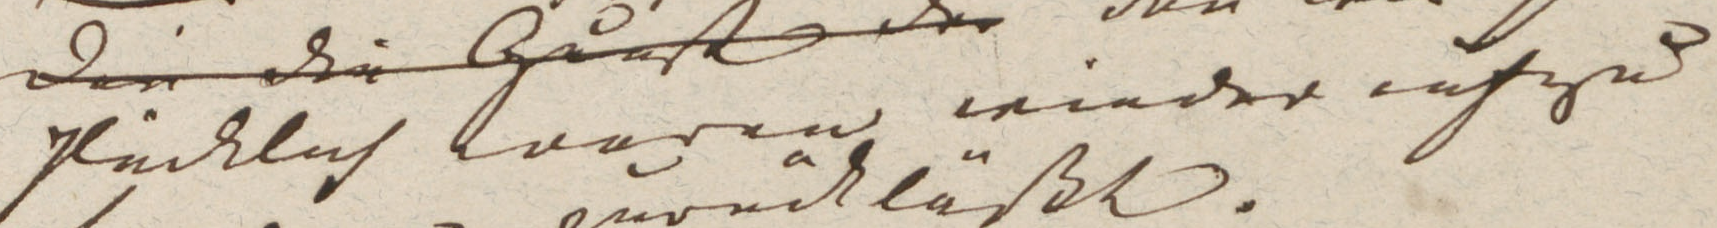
glücklich waren wieder aufzu
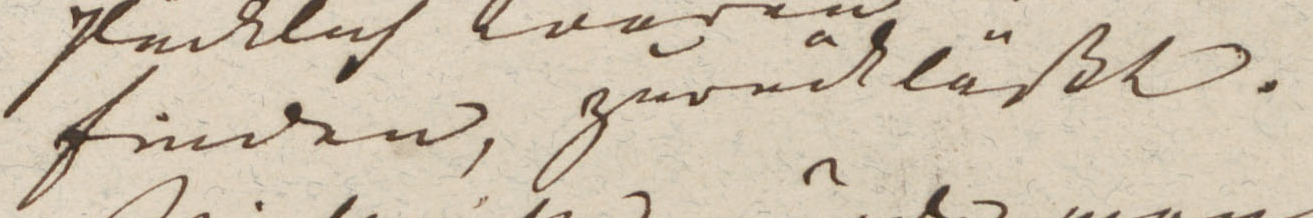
finden, zurücklässt.
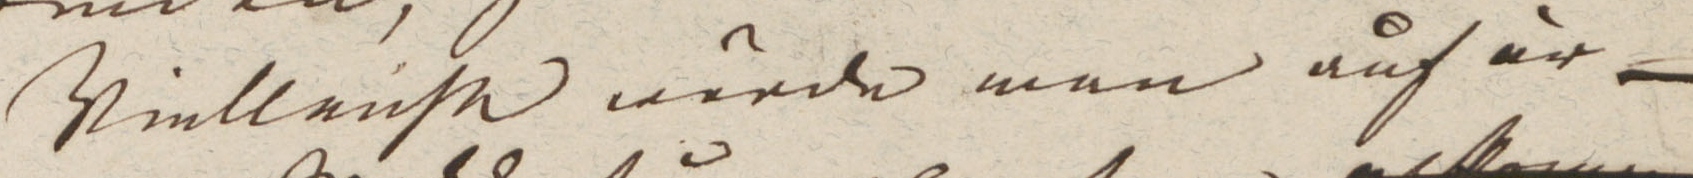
Vielleicht würde man auf ur-
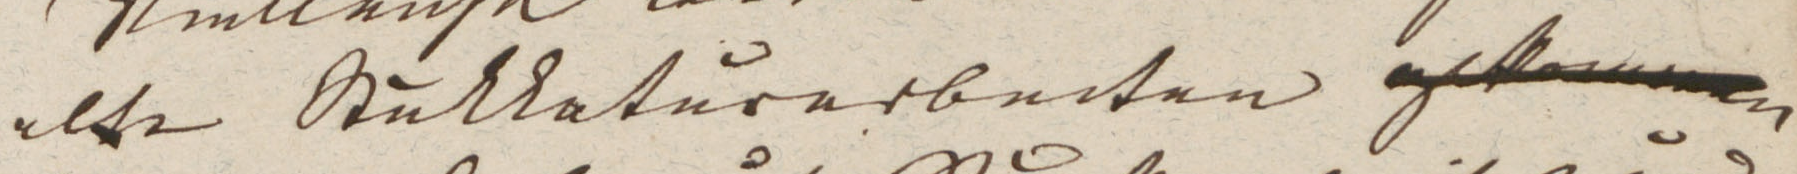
alte Stukkaturarbeiten gekommen
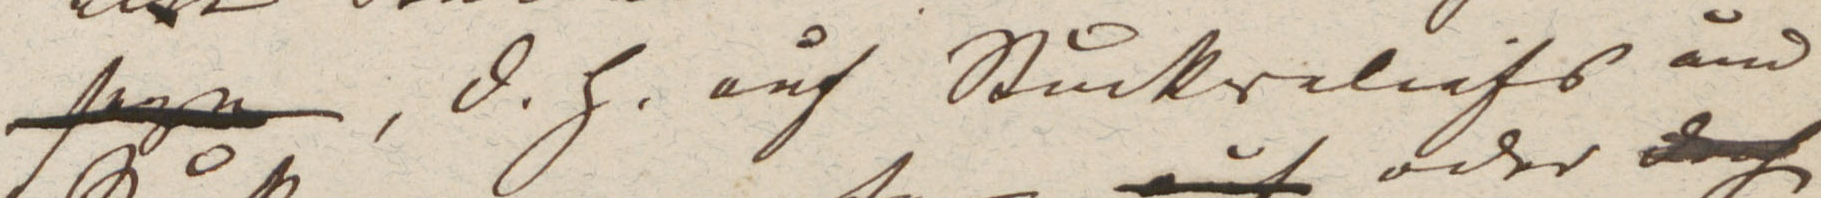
seyn, d. h. auf Stuckreliefs und
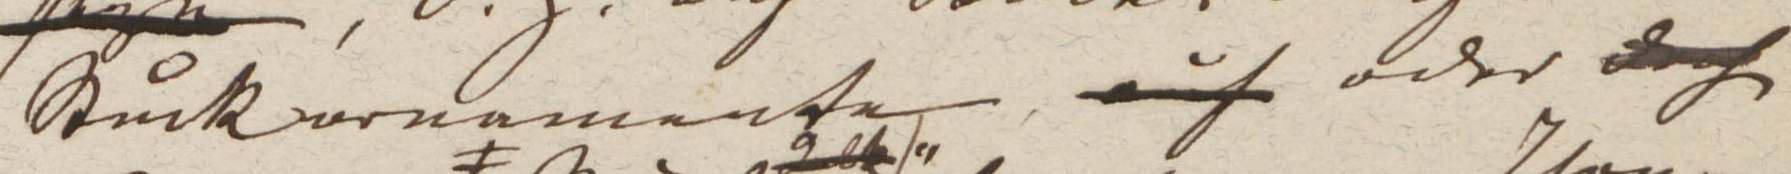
Stuckornamente auf oder dch
